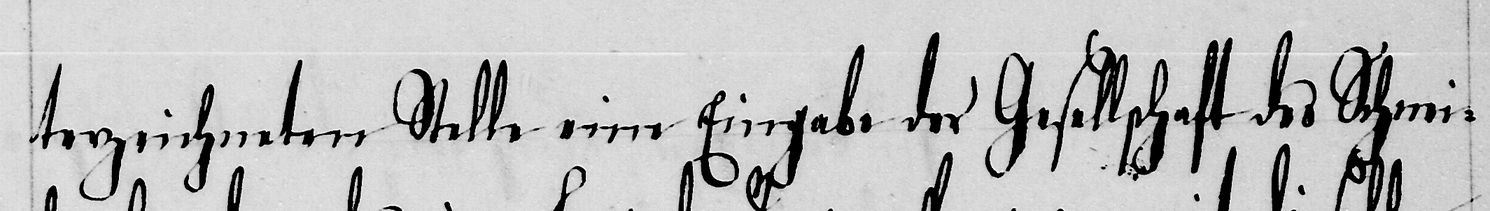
terzeichneten Stelle eine Eingabe der Gesellschaft des Sch¬
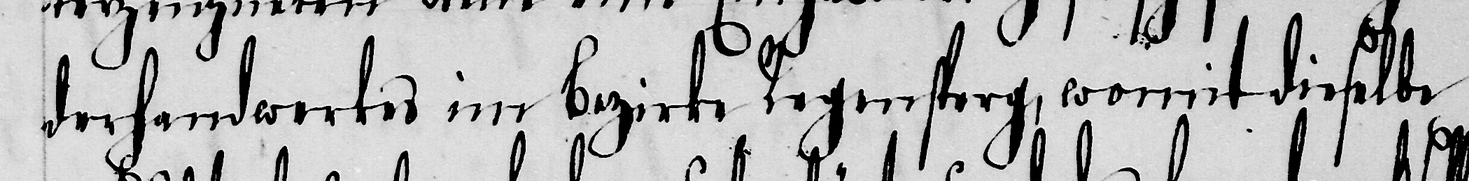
derhandwerkes im Bezirke Regensperg, womit dieselbe
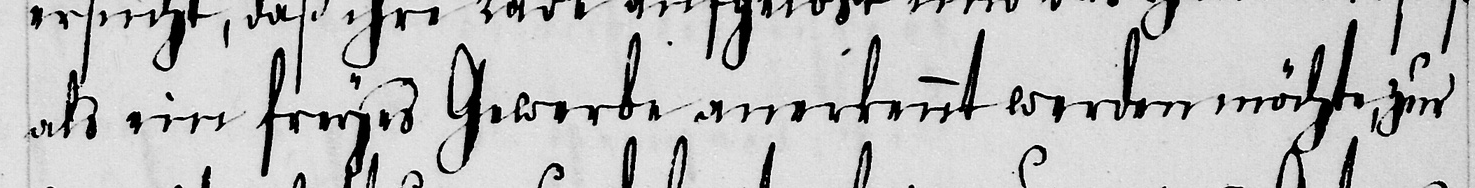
als ein freyes Gewerbe anerkannt werden möchte, zur
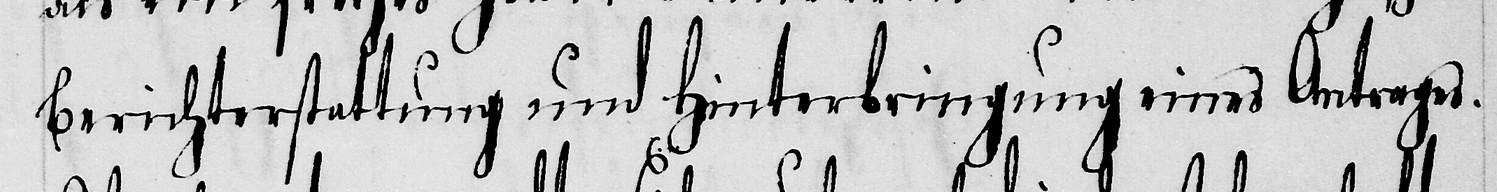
Berichterstattung und Hinterbringung eines Antrages.
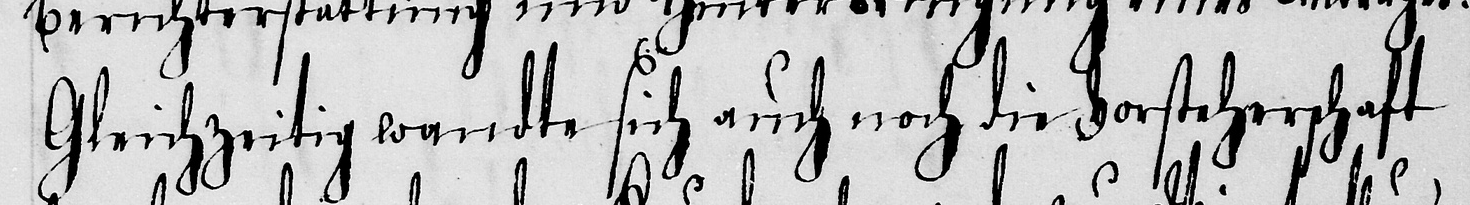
Gleichzeitig wandte sich auch noch die Vorsteherschaft
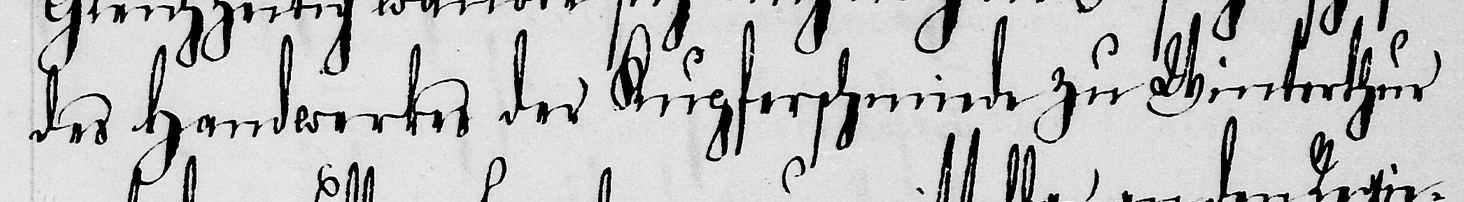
des Handwerkes der Kupferschmiede zu Winterthur
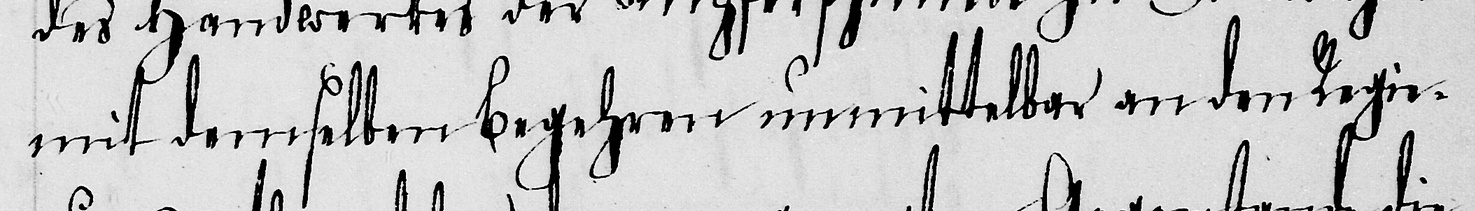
mit demselben Begehren unmittelbar an den Regie¬
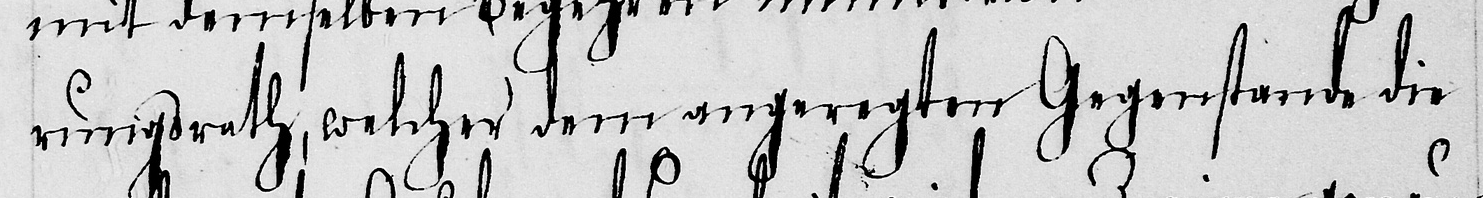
rungsrath, welcher dem angeregten Gegenstande die
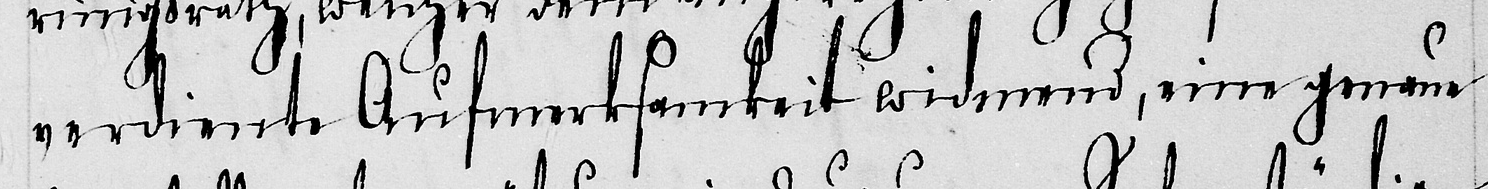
verdiente Aufmerksamkeit widmend, eine genaue
